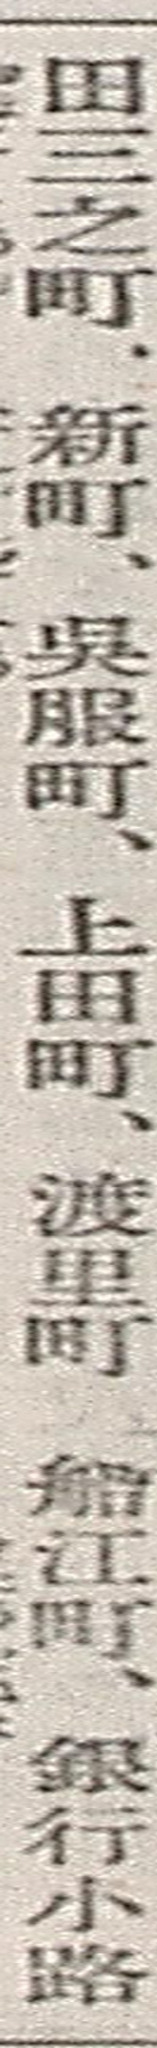田三之町、新町、呉服町、上田町、渡里町、船江町、銀行小路
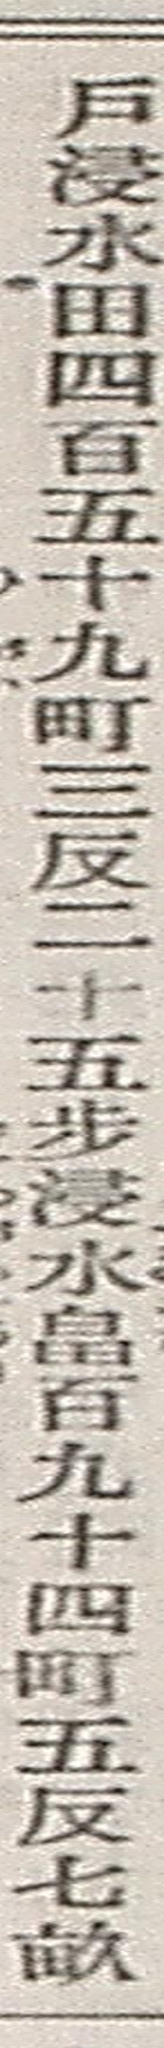戸浸水田四百五十九町三反二十五歩浸水畠百九十四町七反七畝
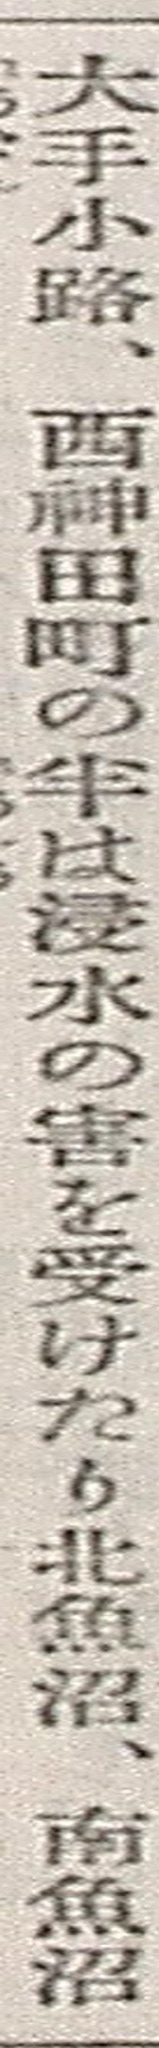大手小路、西神田町の半ば浸水の害を受けたり北魚沼、南魚沼
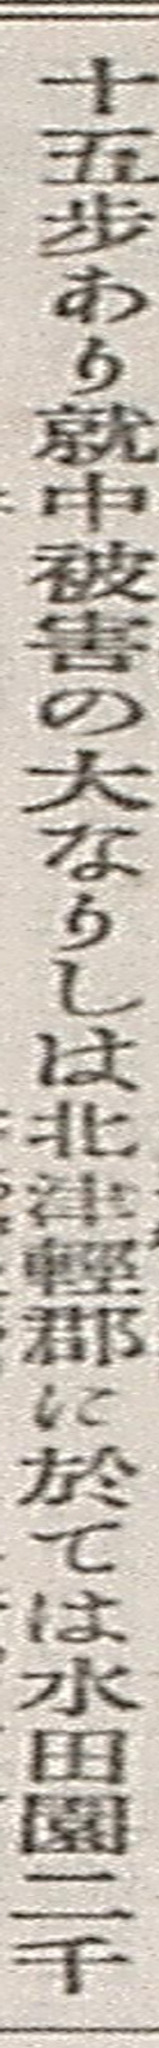十五歩あり就中被害の大なりしは北津軽郡に於ては水田園二千
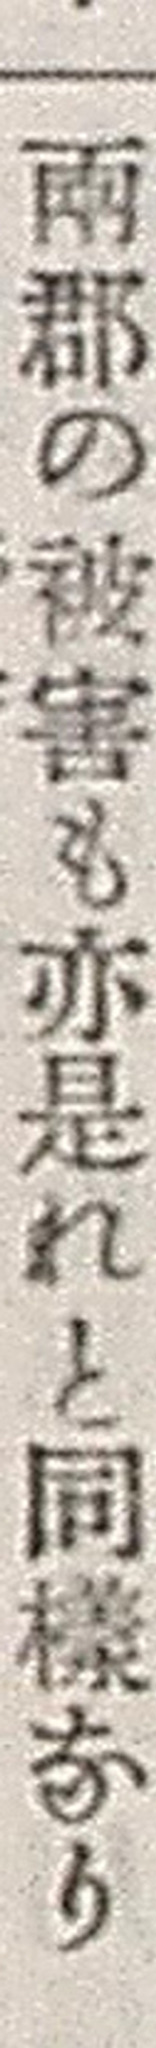両郡の被害も亦是れと同様なり
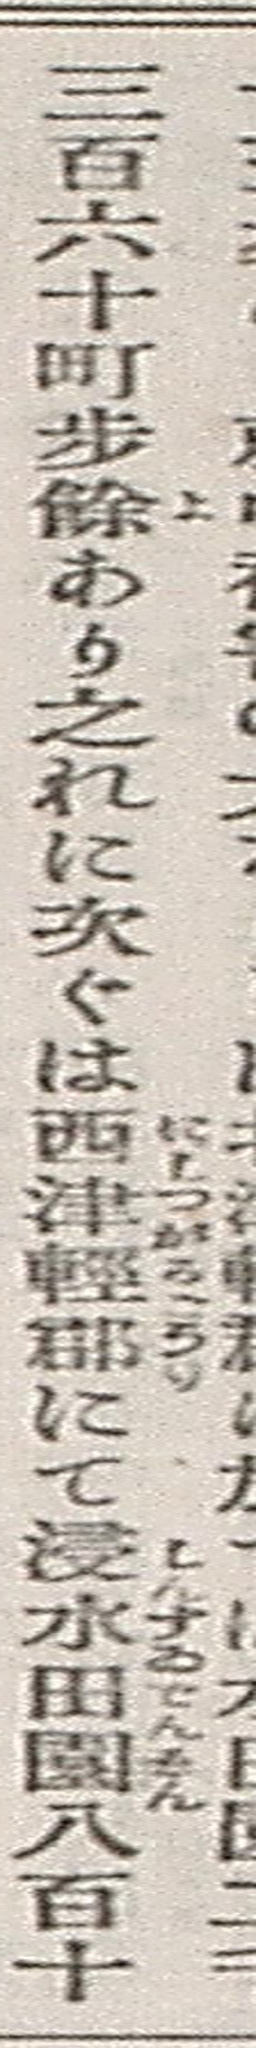三百六十町歩餘あり之れに次ぐは西津軽郡にて浸水田園八百十
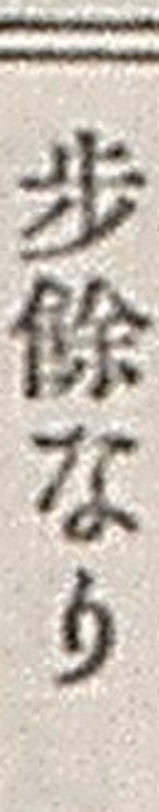歩餘なり
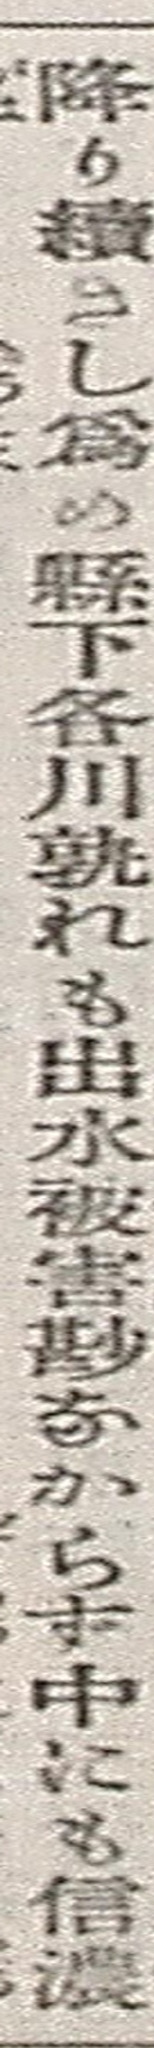降り続きし為め県下各川孰れも出水被害尠なからず中にも信濃
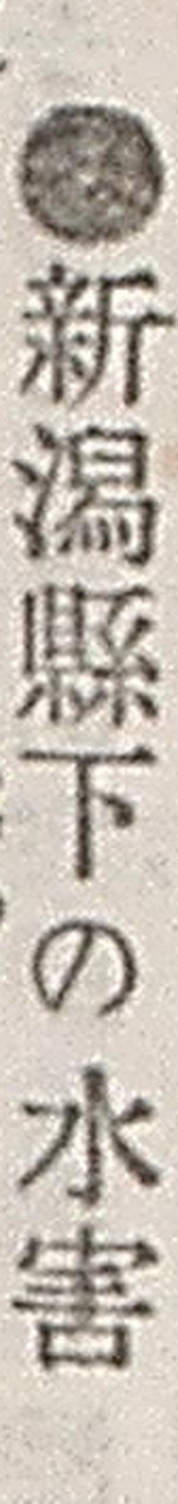●新潟県下の水害
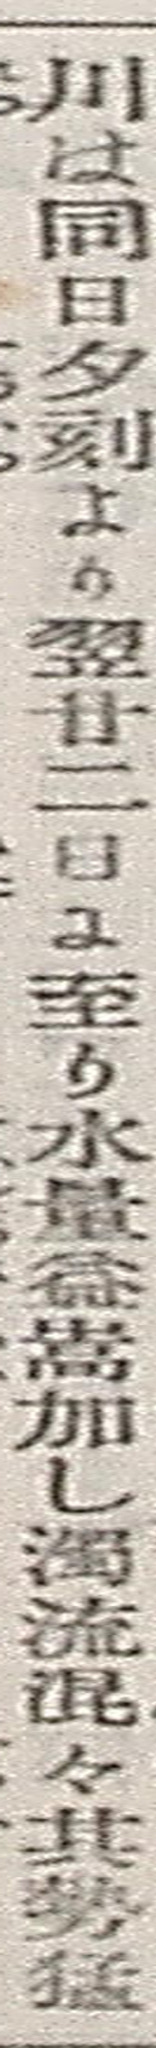川は同日夕刻より翌廿二日に至り水量益嵩加し濁流混々其勢猛
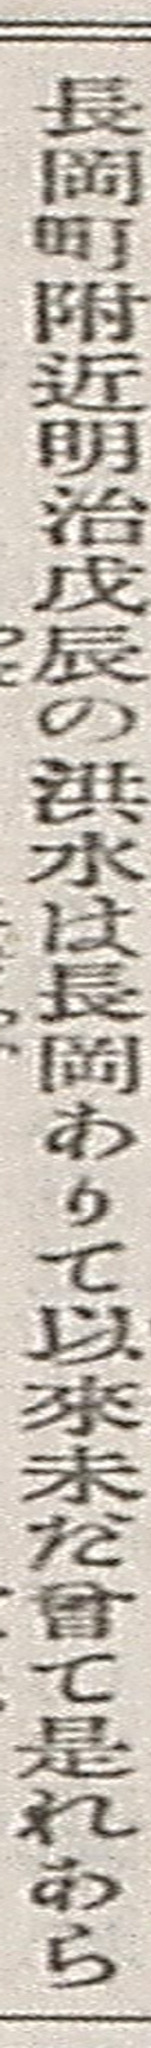長岡町附近明治戊辰の洪水は長岡ありて以来未だ曾て是れあら
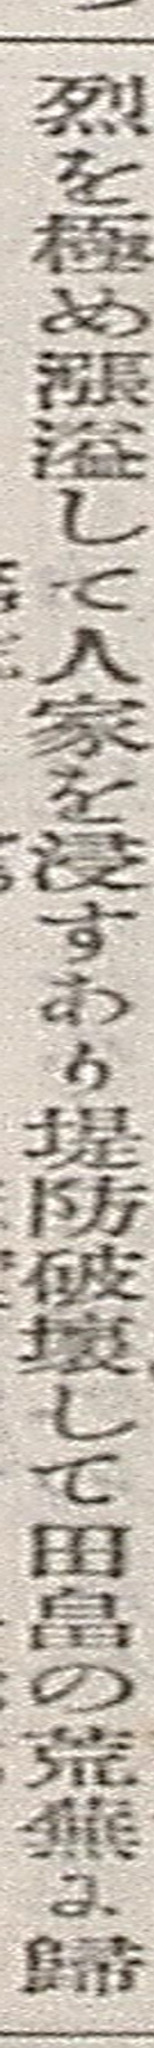烈を極め漲溢して人家を浸すあり堤防破壊して田畠の荒蕪に帰
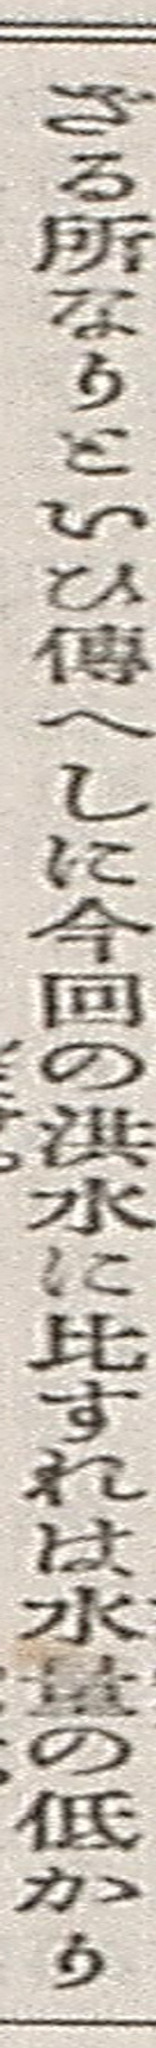ざる所なりといひ伝へしに今回の洪水に比すれば水量の低かり
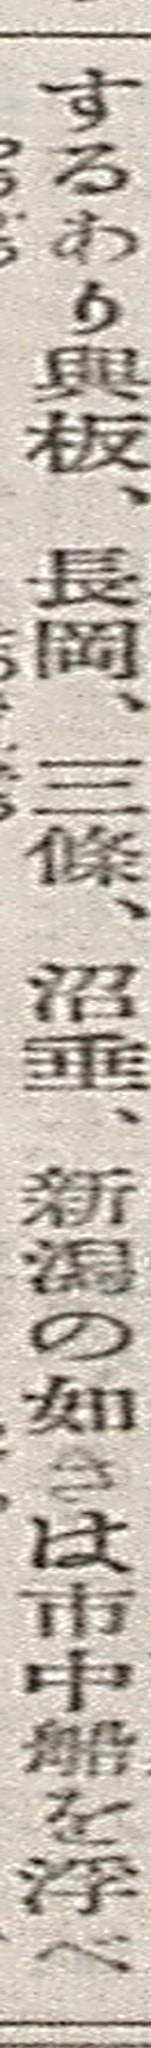するあり与板、長岡、三條、沼垂、新潟の如きは市中船を浮べ
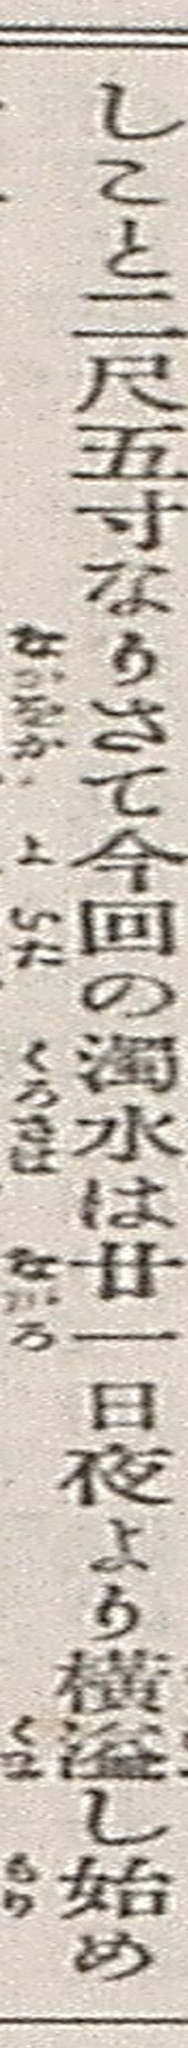しこと二尺五寸なりさて今回の濁水は廿一日夜より横溢し始め
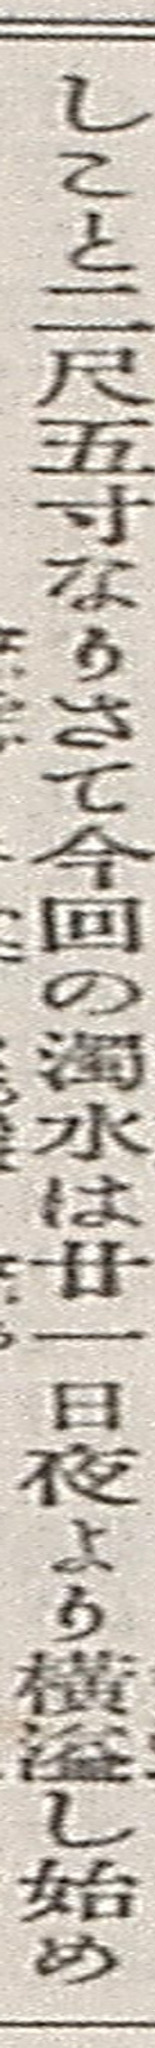しこと二尺五寸なりさて今回の濁水は廿一日夜より横溢し始め
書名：風俗畫報臨時増刊第百二十八號　洪水被害録（下）
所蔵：東京大学地震研究所図書室 Earthquake Research Institute Library, The University of Tokyo, JAPAN
